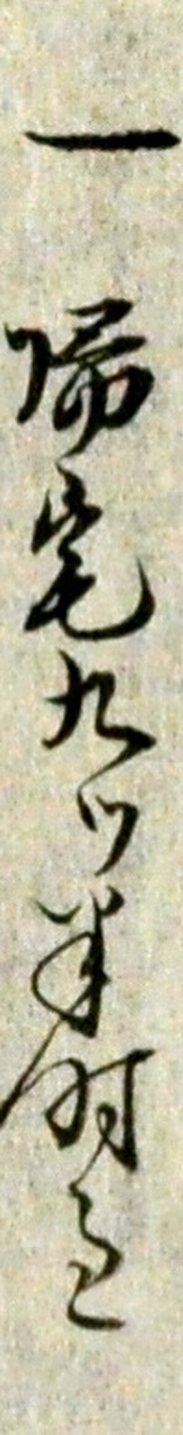一帰宅九ッ半時過
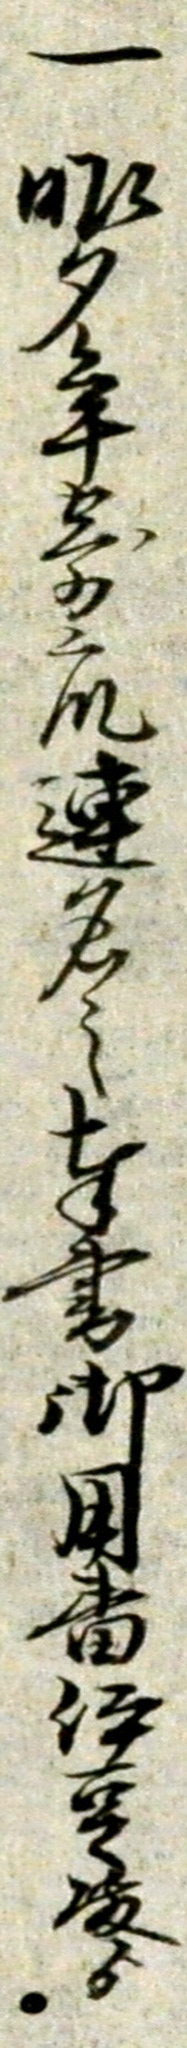一昨夕年寄衆連名之奉書御用番伊豆殿ゟ
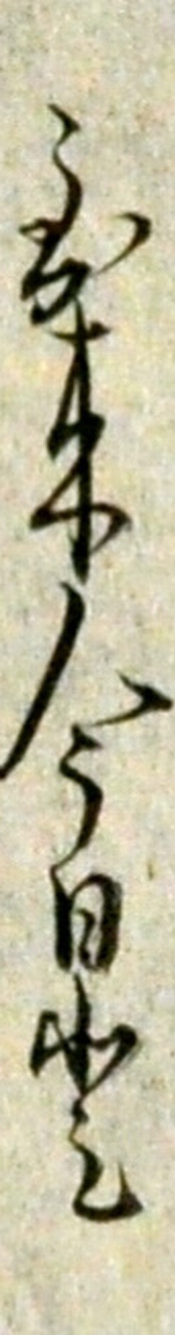到来今日登
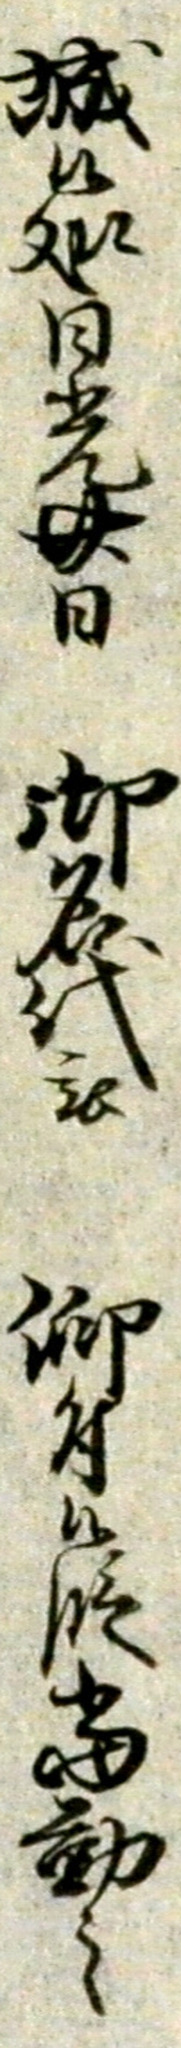城候処日光廿日御名代被仰付候段当勤之
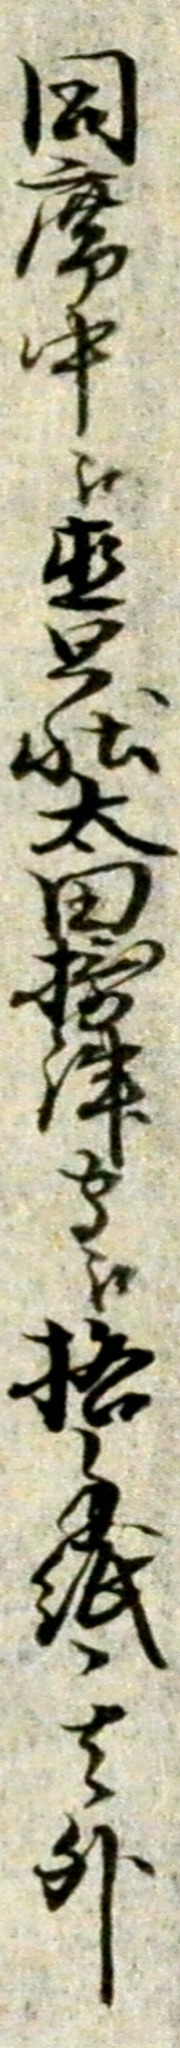同席中江直廻状太田摂津守江格手紙其外
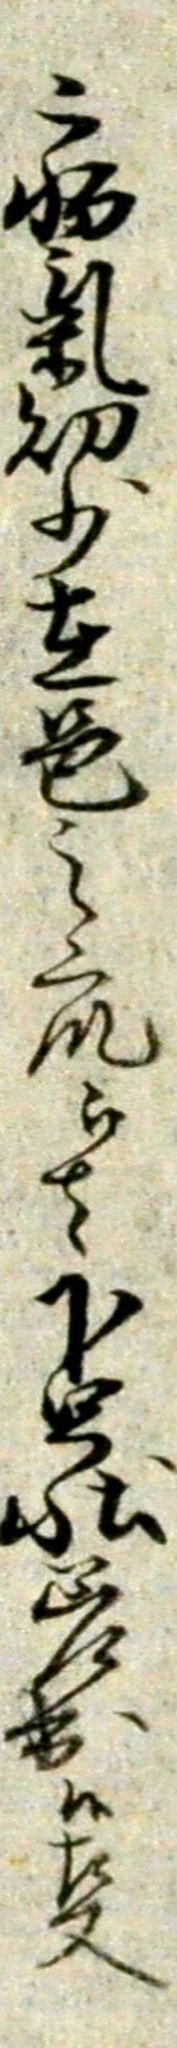病気幼少在邑之衆江者下廻状差出候事
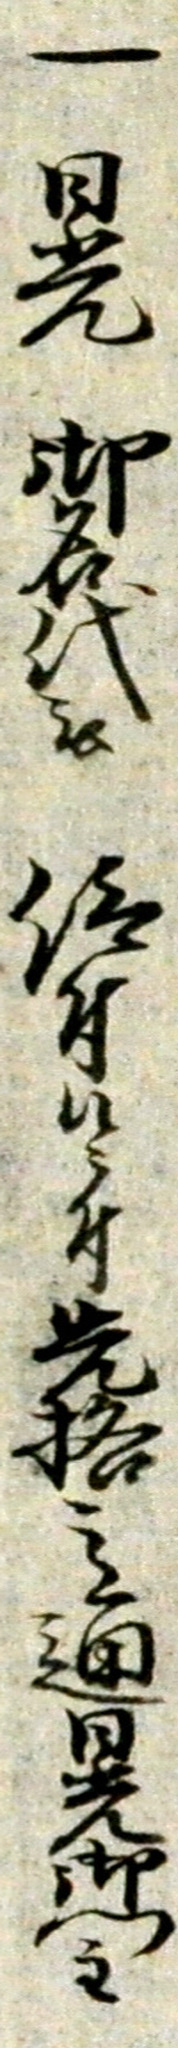一日光御名代被仰付候ニ付先格之通日光御門主
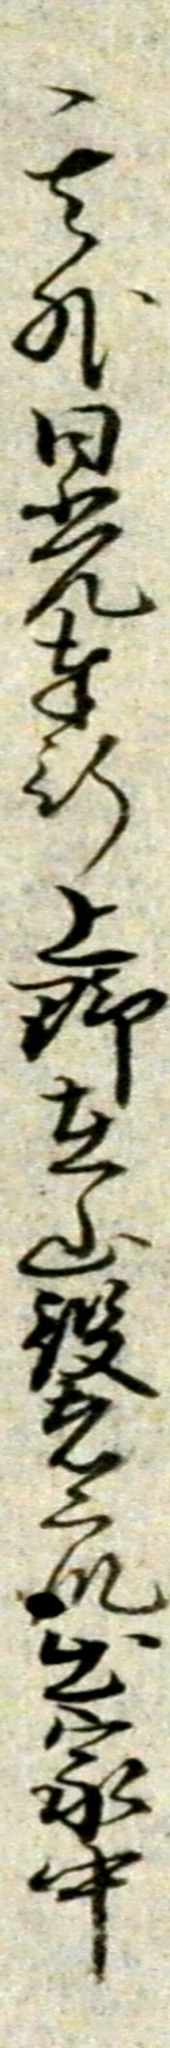其外日光奉行上野在山役者衆出家中
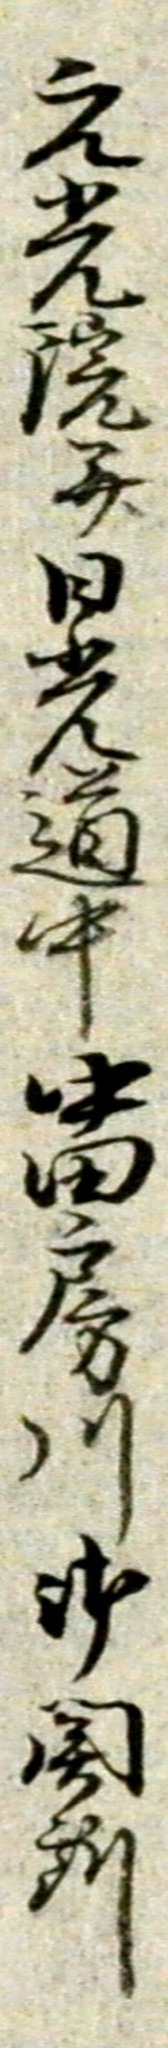元光院并日光道中中田房川御関所
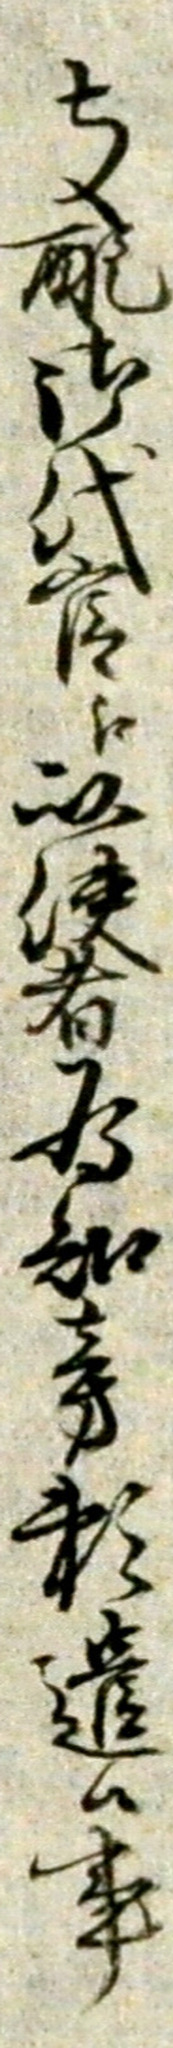支配御代官江以使者為知旁頼遣候事
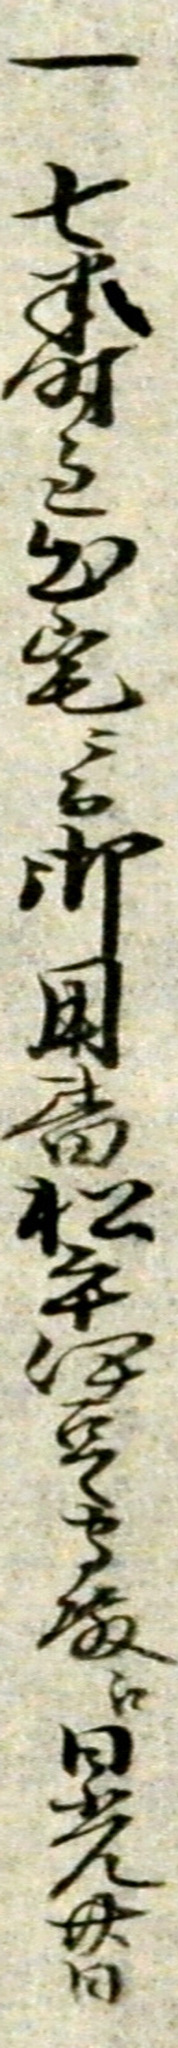一七半時過出宅ニ而御用番松平伊豆守殿江日光廿日
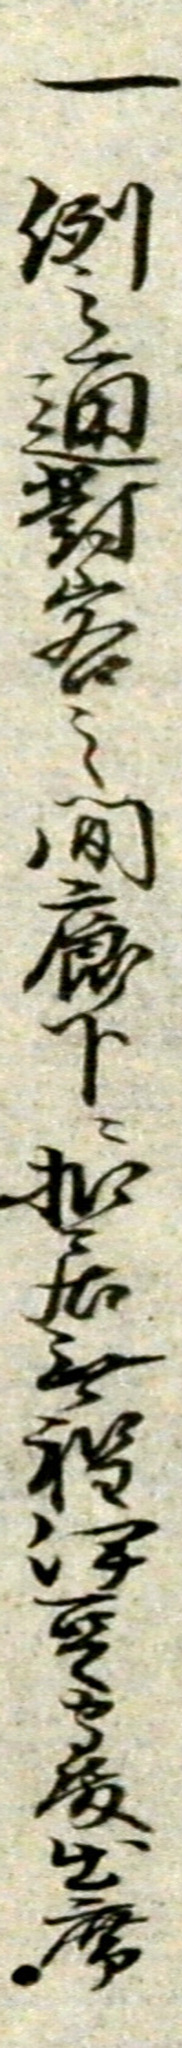一例之通対客之間廊下ニ扣居無程伊豆守殿出席
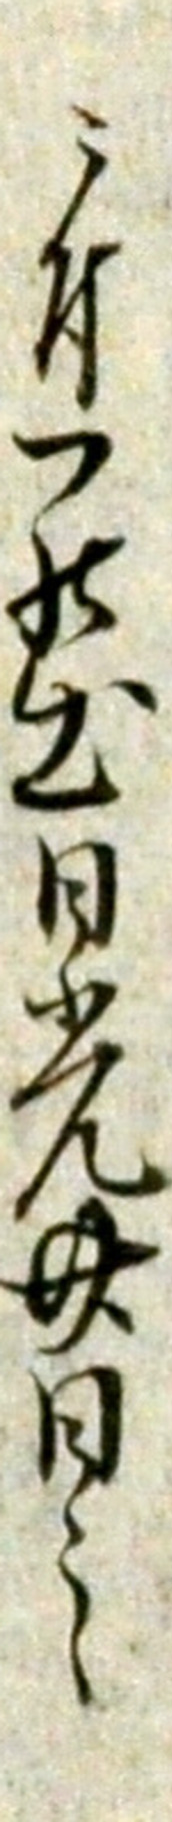ニ付罷出日光廿日之
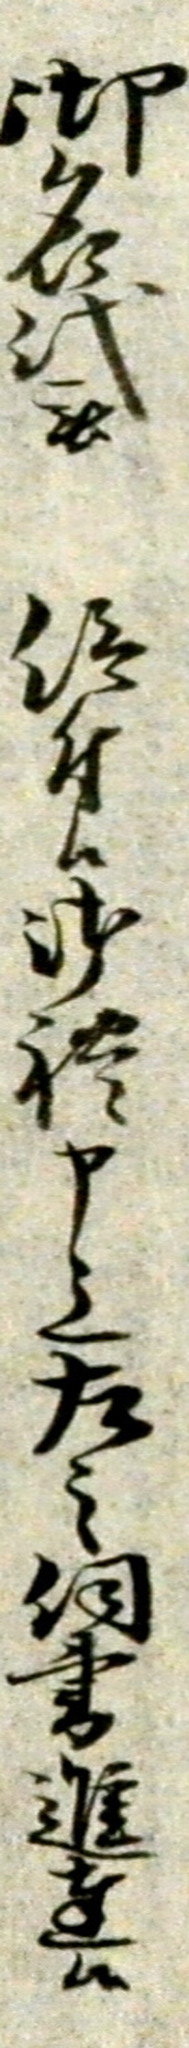御名代被仰付候御礼申上左之伺書進達候
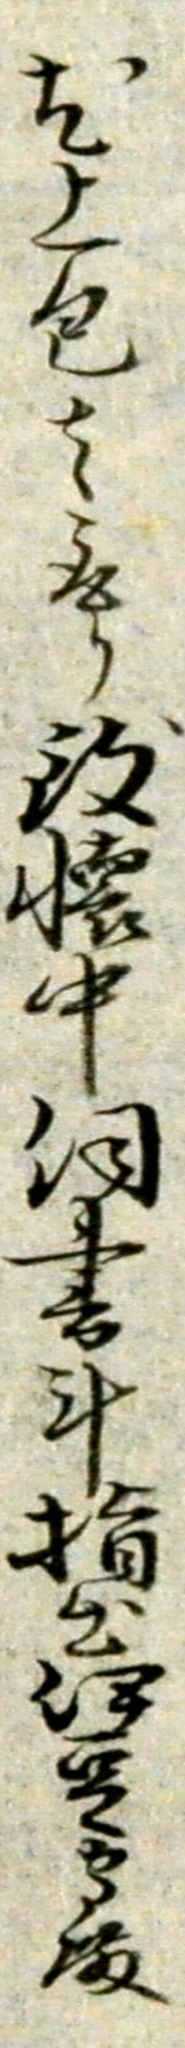尤上包者取り致懐中伺書計指出伊豆守殿

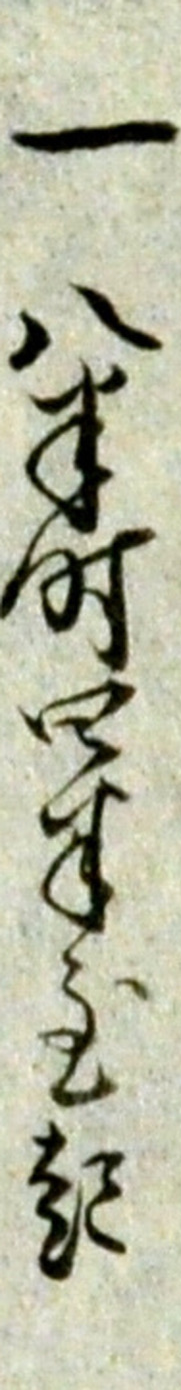一八半時四半至起
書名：日光御名代相勤候節ノ留
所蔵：伊那市立高遠町図書館・合同会社AMANE
